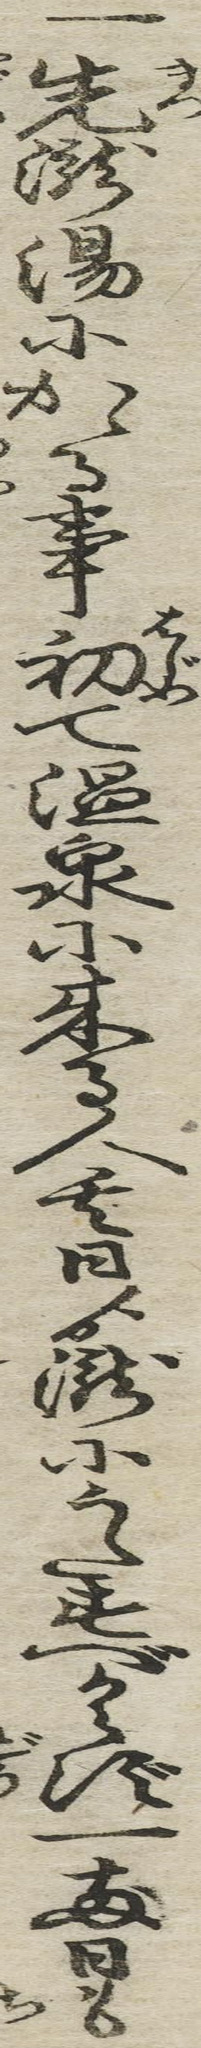一先瀧湯にかゝる事初て温泉に来る人其日より瀧にうたすべからず一両日も
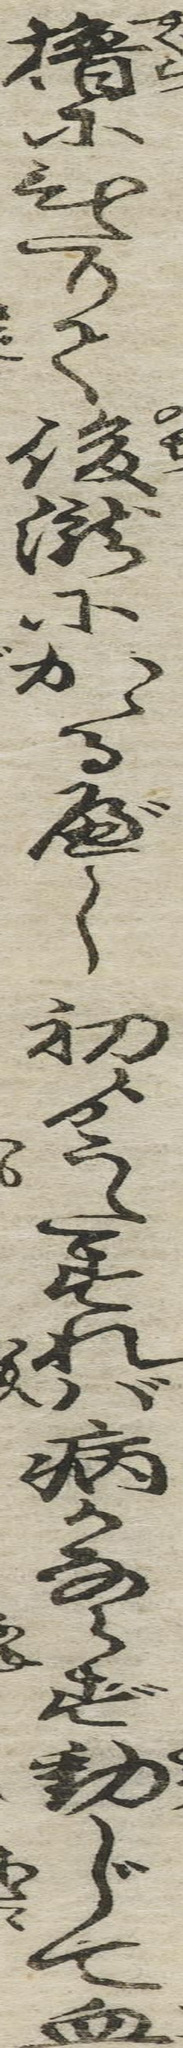櫓にひたりて後瀧にかゝるべし初よりうたすれば病かならず動じて血
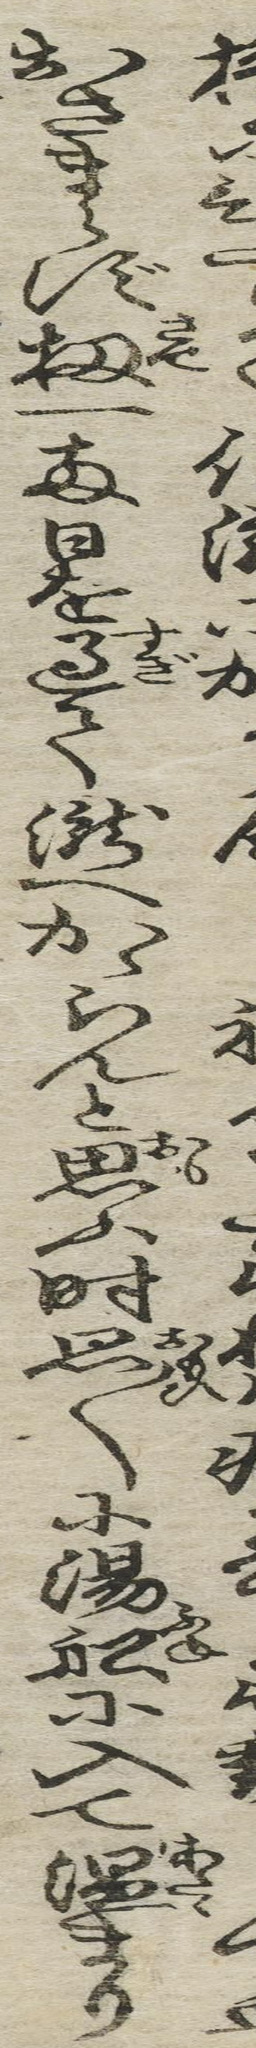おさまらず扨一両日を過て瀧へかゝらんと思ふ時思〳〵に湯船に入て温まり
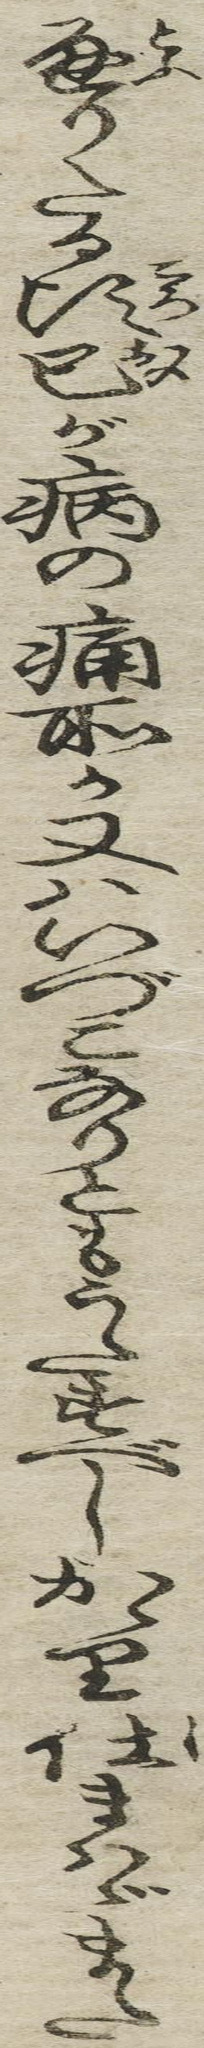通りたる頃己が病の痛所か又はいづこなりともうたすべしかゝり仕まはゞまた
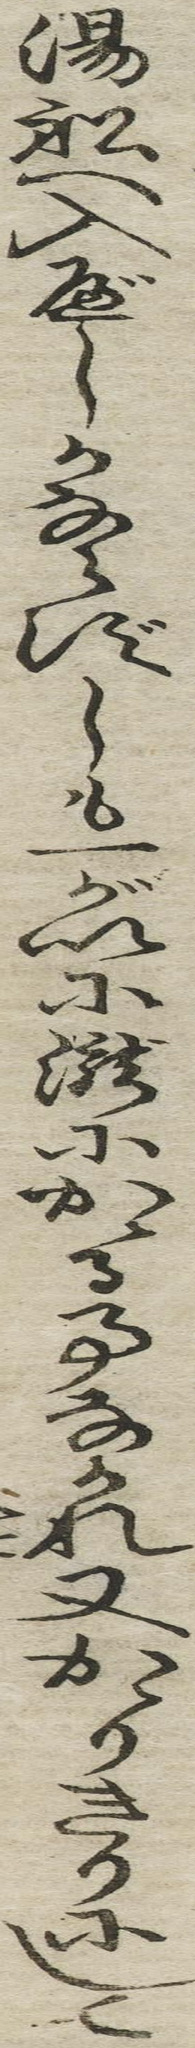湯船へ入べしかならずしも一がいに瀧にかゝる事なかれ又かゝりきりにして
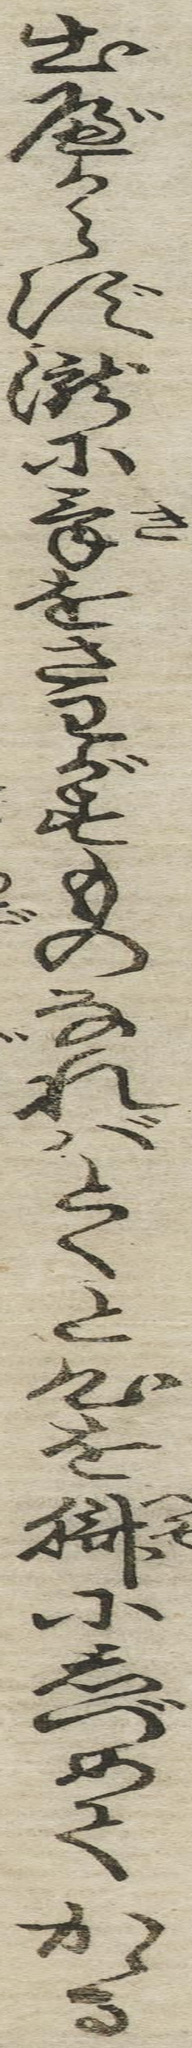出べからず瀧に氣をさわがすものなればとくと心を臍にしづめてかゝる
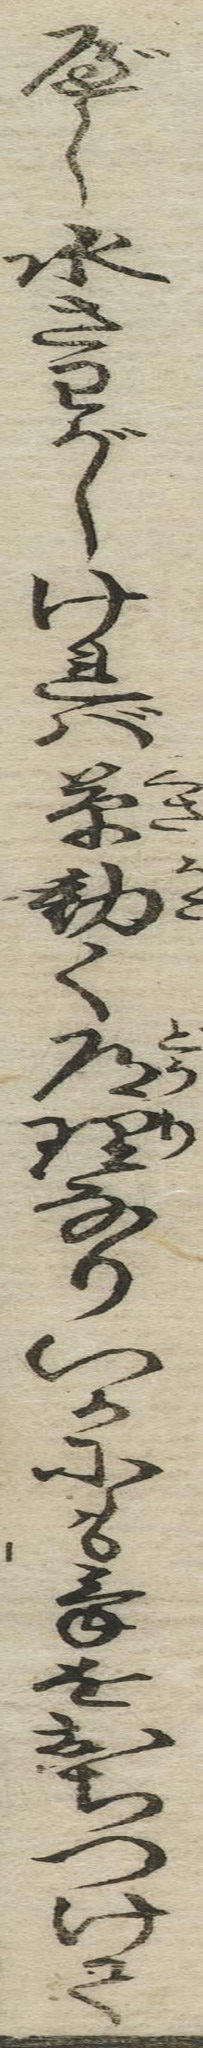べし水さわがしければ草動く道理なりいかにも氣をおちつけて

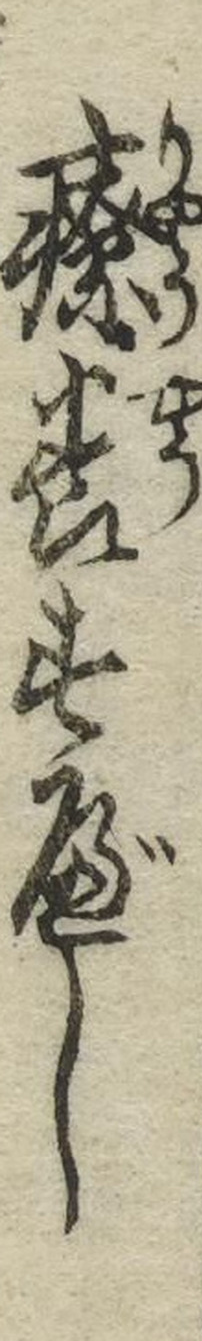療養すべし
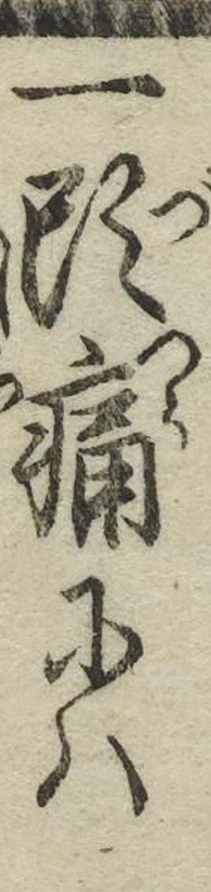一頭痛には
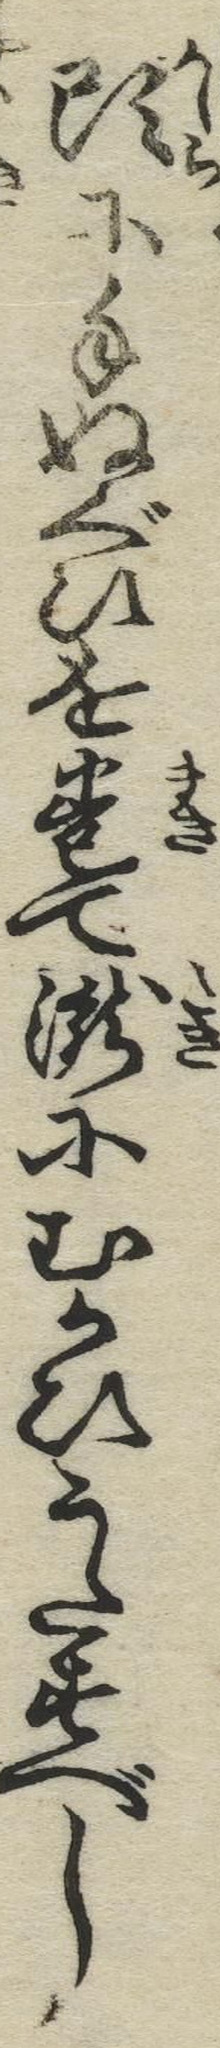頭に手ぬぐひを巻て瀧にむかひうたすべし
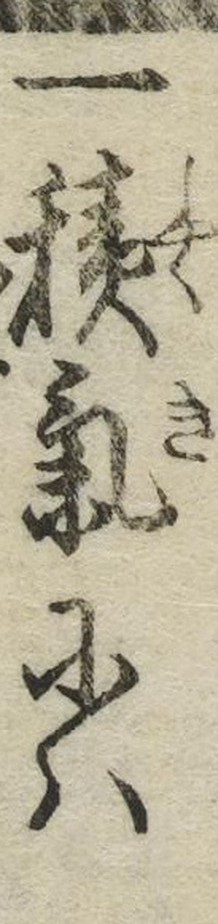一積氣には
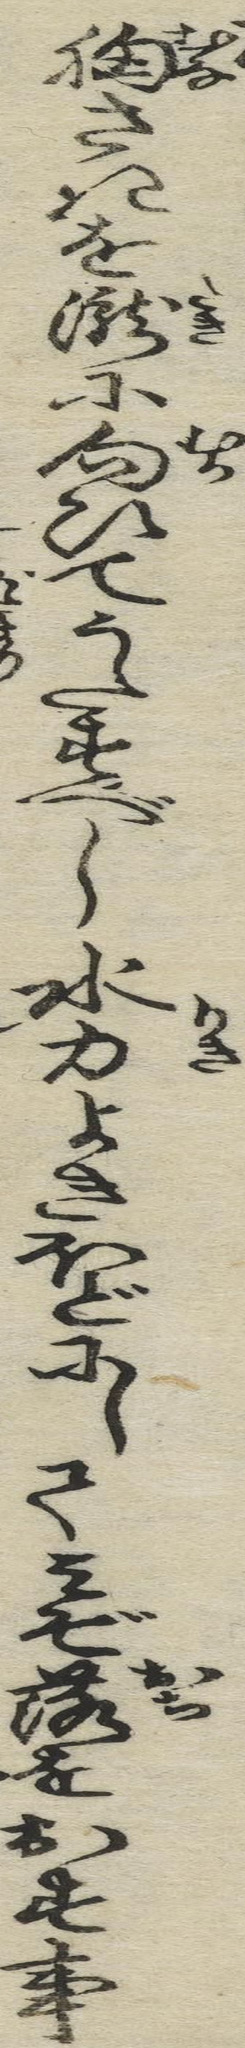胸さきを瀧に向ひてうたすべし水力よきほどにしてみぞ落をおす事
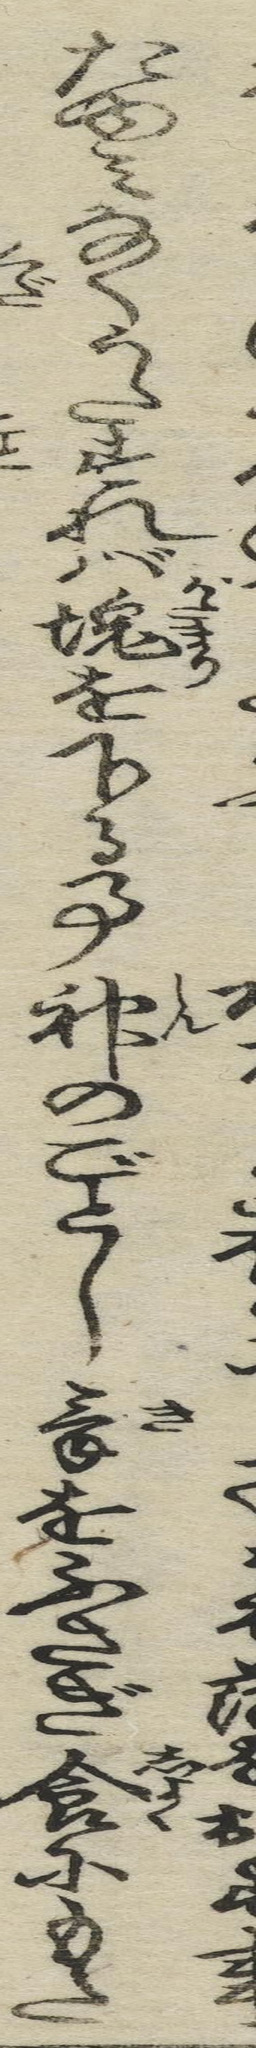たゆみなくうたすれば塊を下る事神のごとし氣をふさぎ食にもた
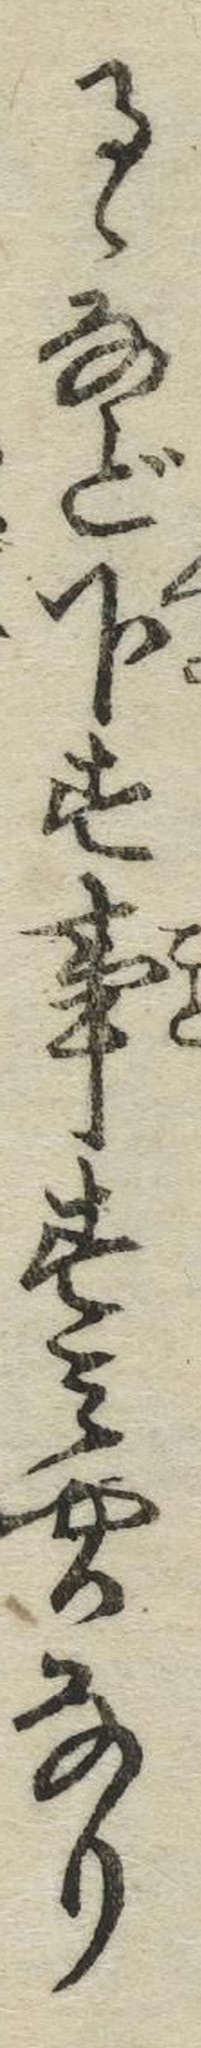るゝなど下すす事すみやかなり
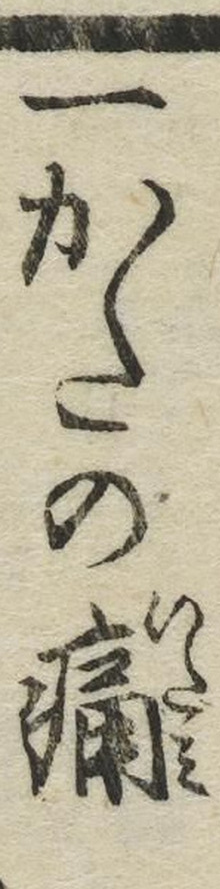一かたの痛
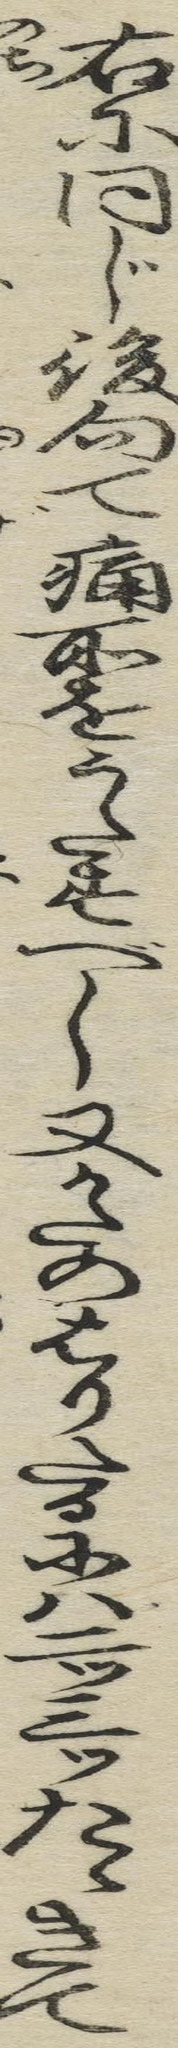右に同じ後向て痛所をうたすゔぇし又かたのはりたるには二つ三つたゝきて
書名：箱根七湯　温泉圖會　全
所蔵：東京大学地震研究所図書室 Earthquake Research Institute Library, The University of Tokyo, JAPAN
